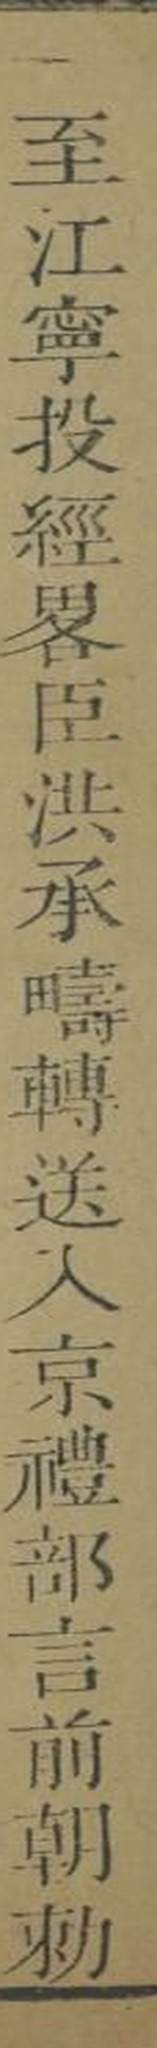至江寧投経略臣洪承疇転送入京礼部言前朝勅
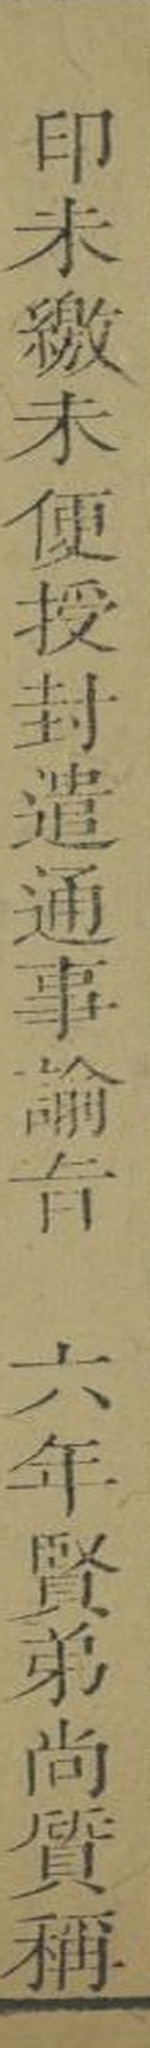印未繳未便授封遣通事諭旨六年賢弟尚質称
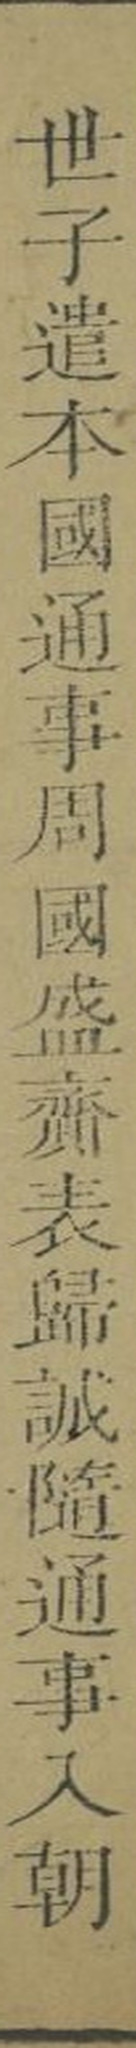世子遣本国通事周国盛齎表帰誠随通事入朝
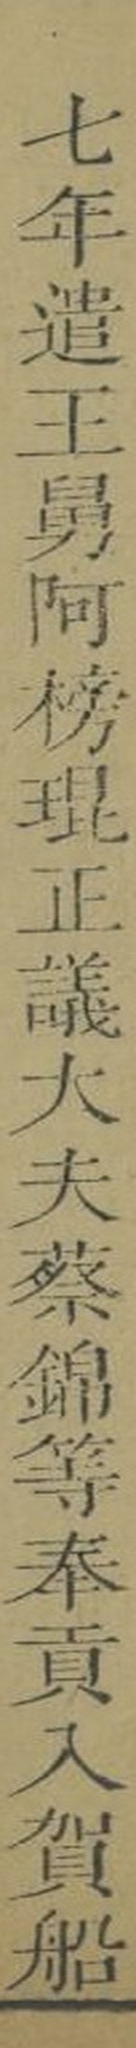七年遣王舅阿榜琨正議大夫蔡錦等奉貢入賀船
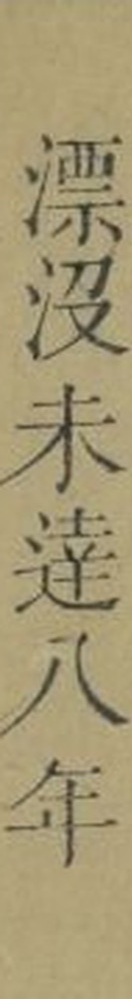漂没未達八年
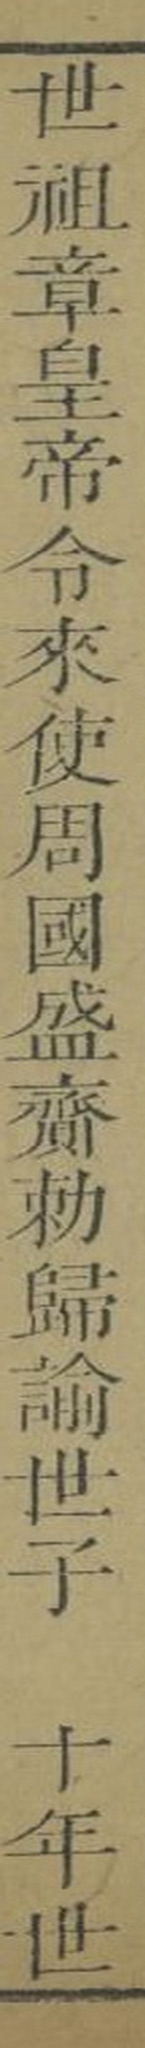世祖章皇帝令来使周国盛齎勅帰諭世子十年世
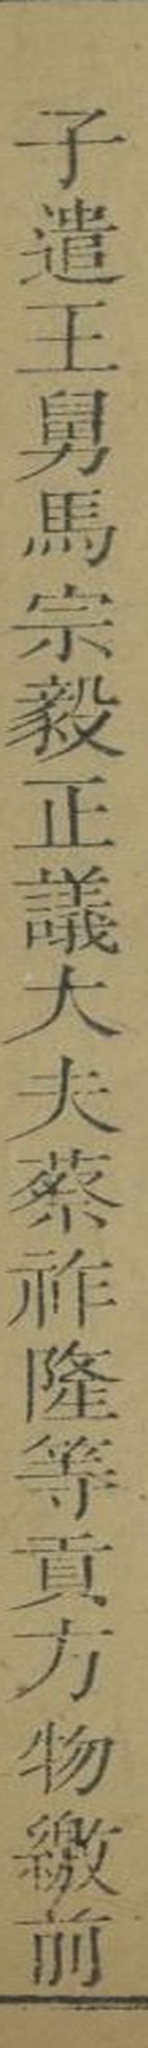子遣王舅馬宗毅正議大夫蔡祚隆等貢方物繳前
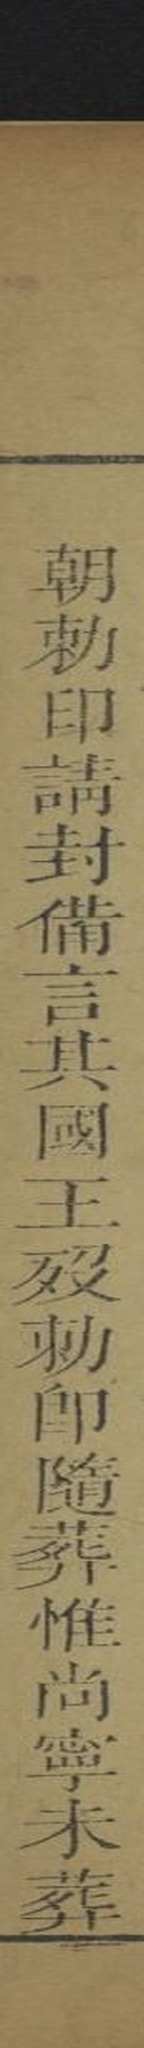朝勅印請封備言其国王歿勅即随葬惟尚寧未葬
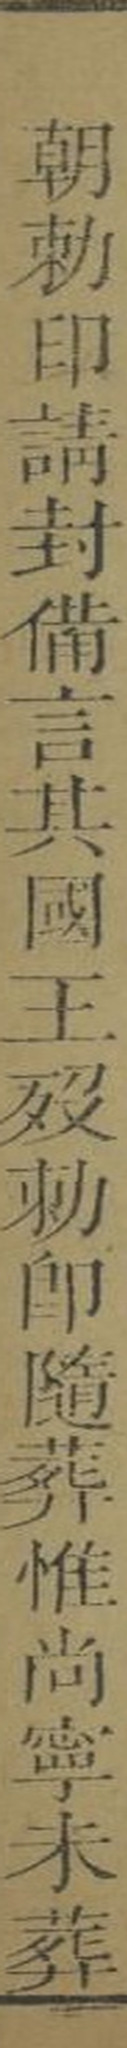朝勅印請封備言其国王歿勅即随葬惟尚寧未葬

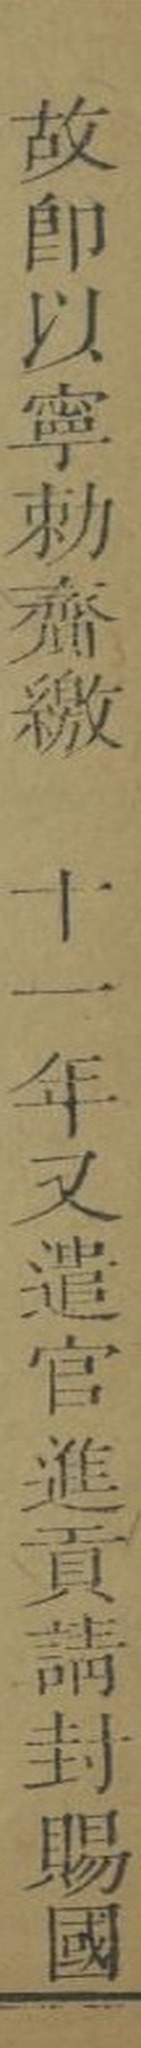故即以寧勅齎繳十一年又遣官進貢請封賜国
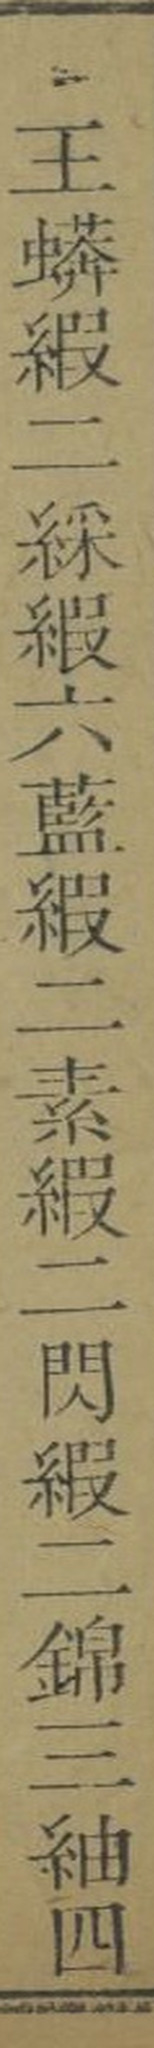王蟒緞二綵緞六藍緞二素緞二閃緞二錦三紬四
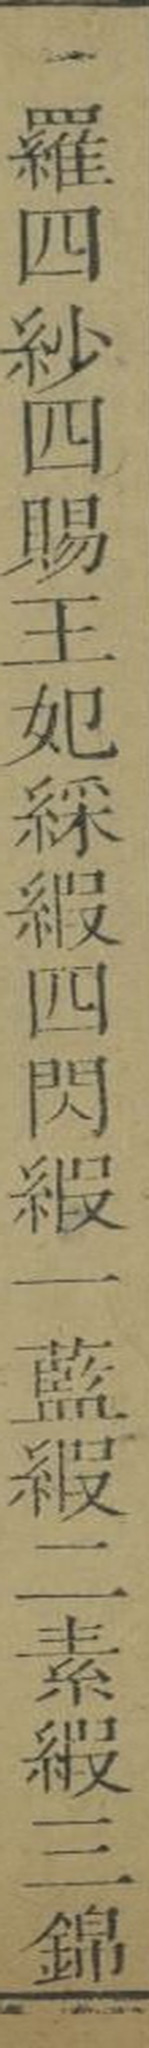羅四紗四賜王妃綵緞四閃緞一藍緞二素緞三錦
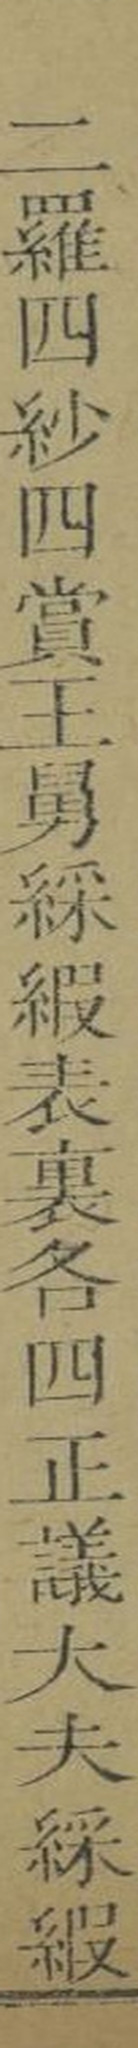二羅四紗四賞王舅綵緞表裏各四正議大夫綵緞
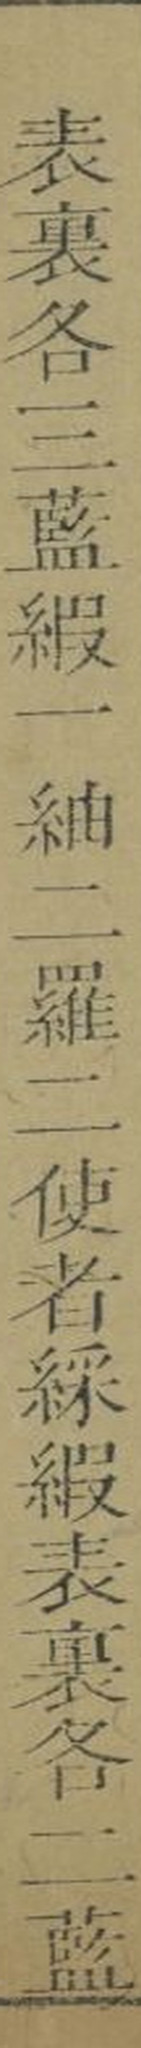表裏各三藍緞一紬二羅二使者綵緞表裏各二藍
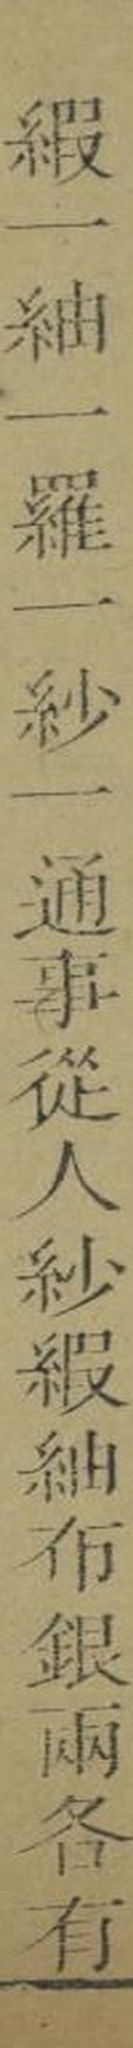緞一紬一羅一紗一通事従人紗緞紬布銀両各有
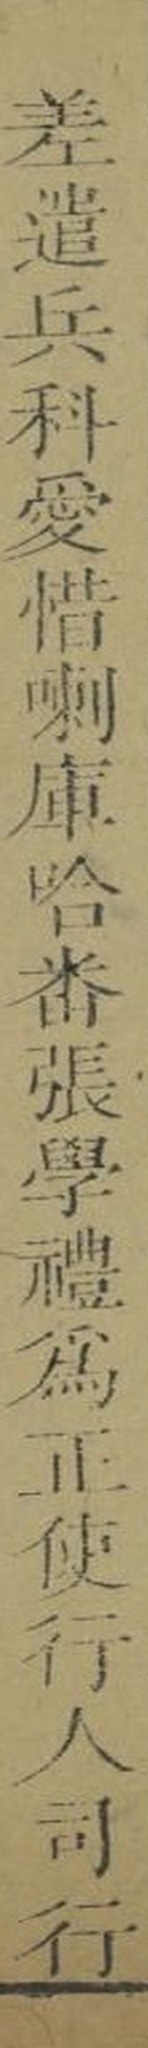差遣兵科愛惜喇庫哈番張学礼為正使行人司行
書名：中山伝信録 巻四
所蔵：University of the Ryukyus Library
